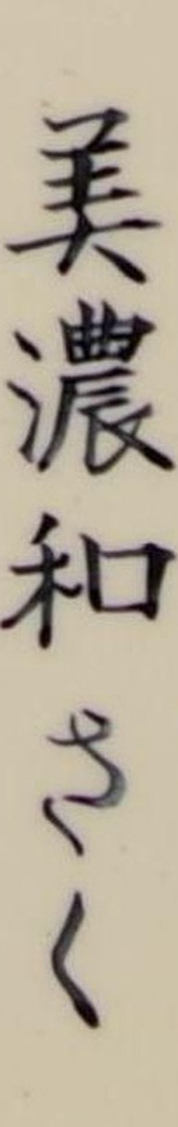美濃和さく
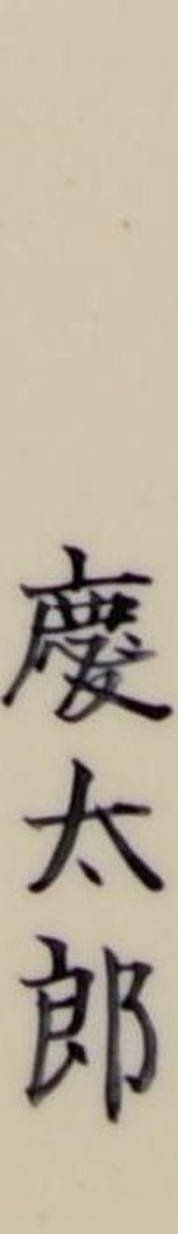慶太郎
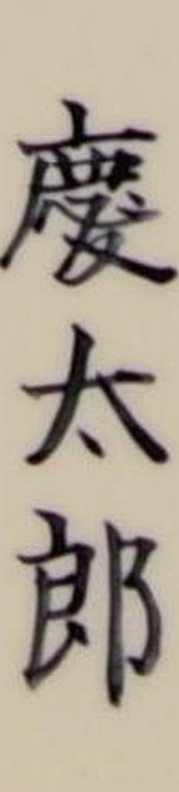慶太郎
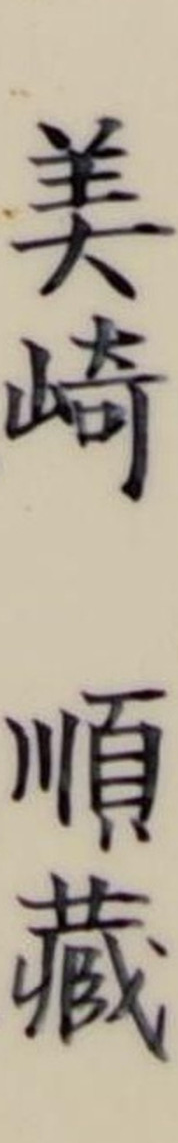美崎順蔵
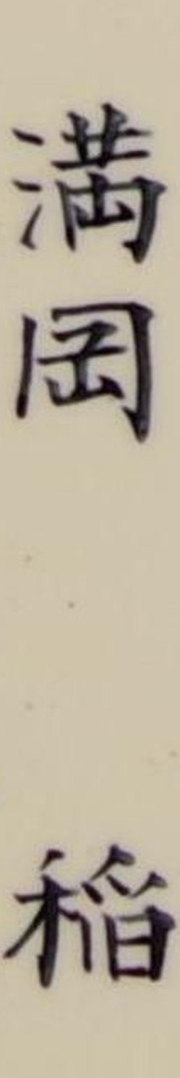満岡稲
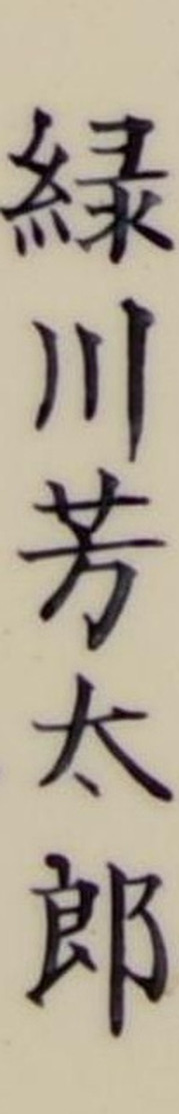緑川芳太郎
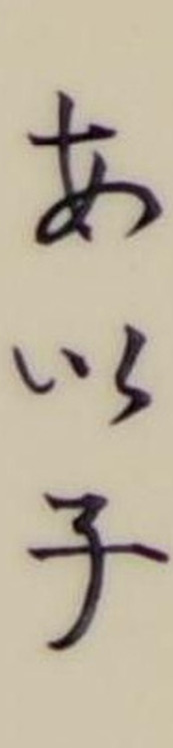あい子
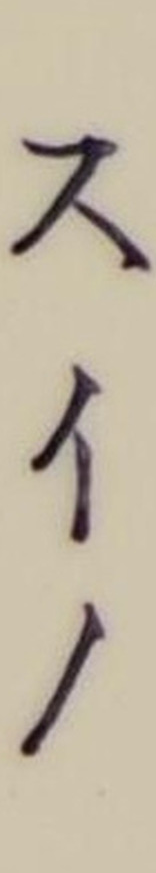スイノ
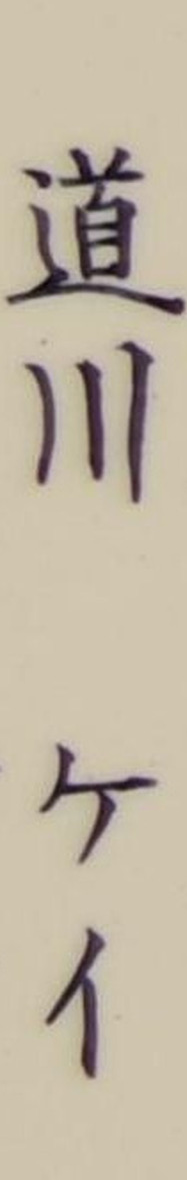道川ケイ
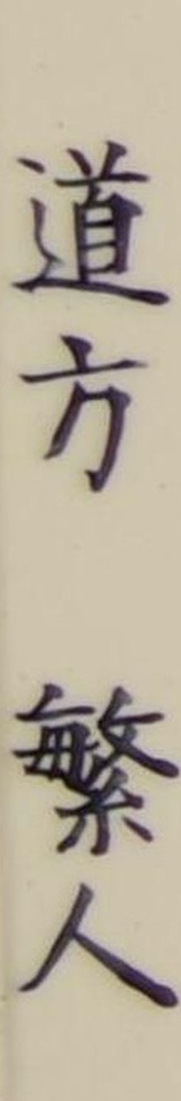道方繁人

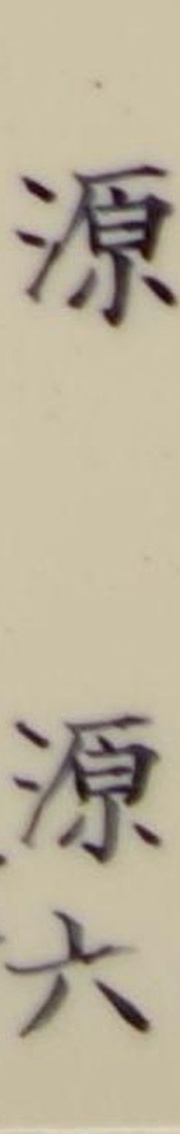源源六
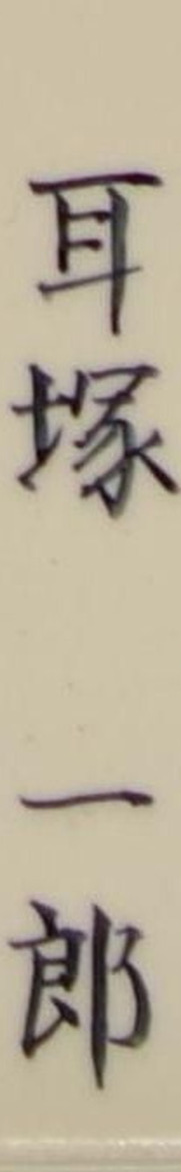耳塚一郎
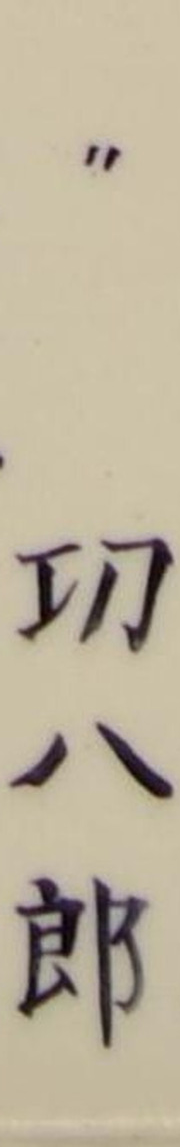㓛八郎
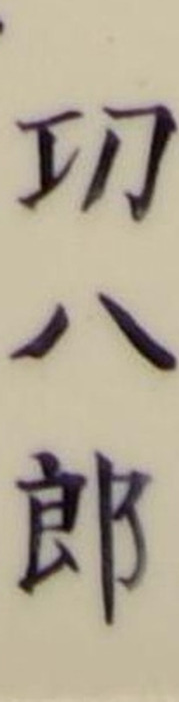㓛八郎
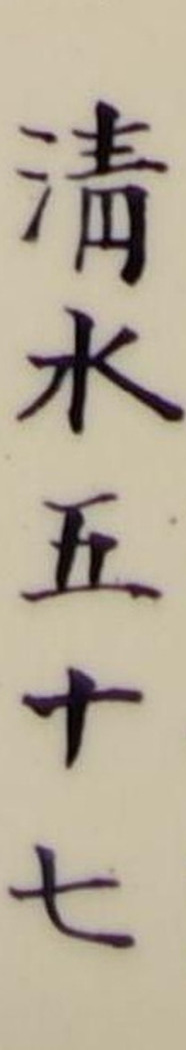清水五十七
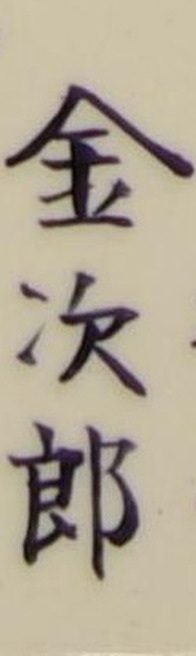金次郎
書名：E~L
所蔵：高野山金剛峯寺
